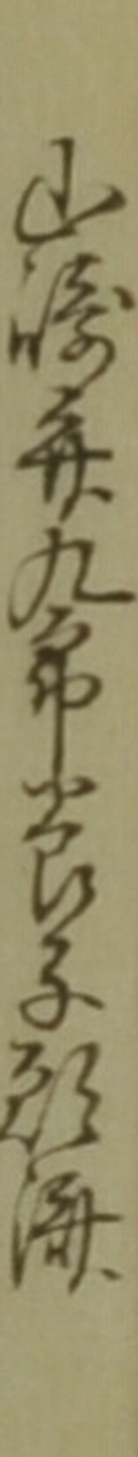山崎弁九郎養子願済
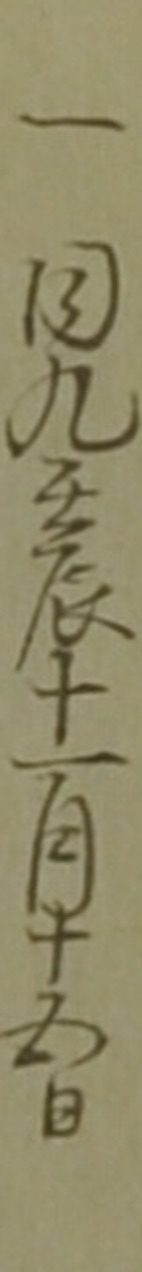一同九壬辰十一月十五日
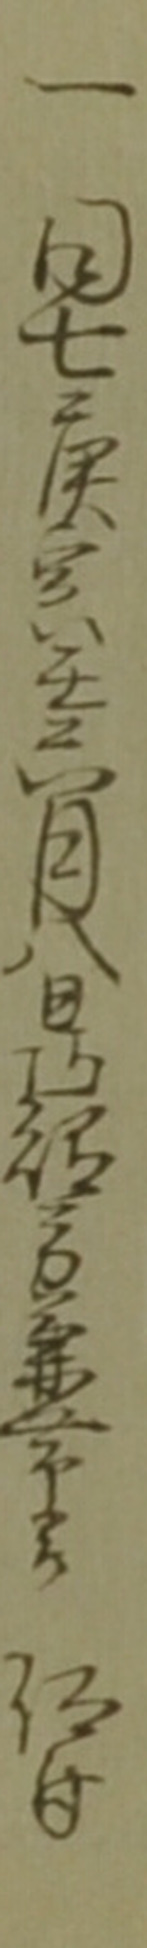一同七庚寅閏六月八日御賄方兼帯被仰付
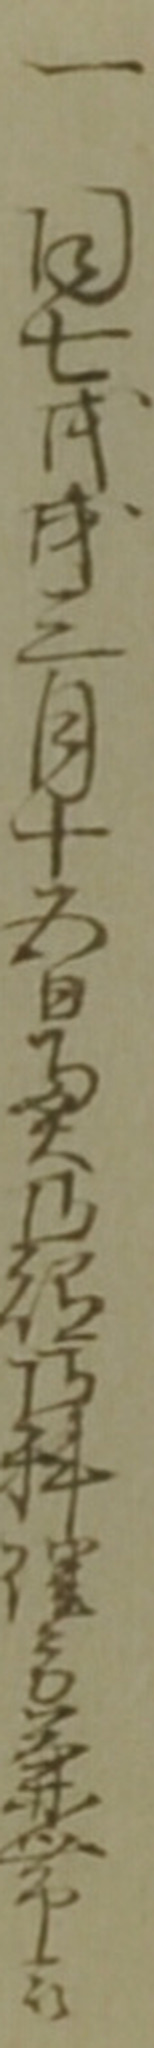一同七戊戌三月十五日奥御賄御料理方兼帯被
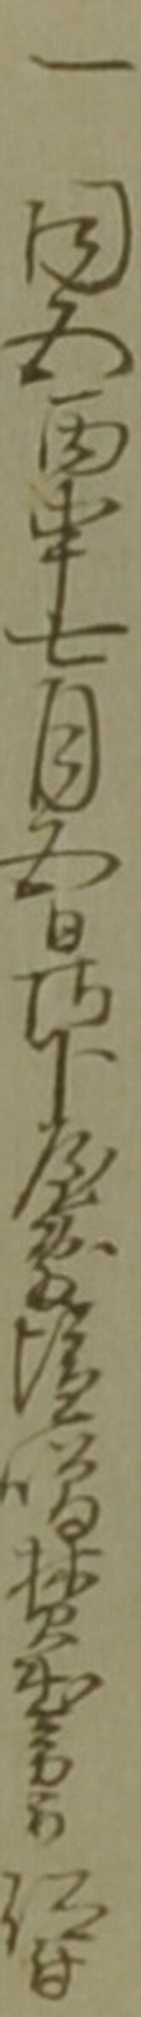一同五丙申七月五日御下屋敷塩噌焚出方被仰付
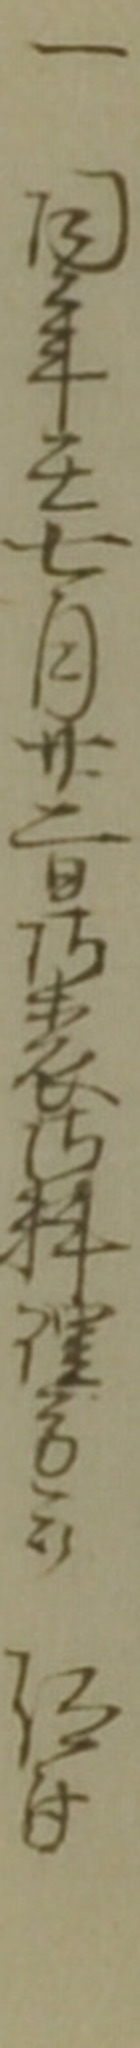一同年閏七月廿二日御表料理方被仰付
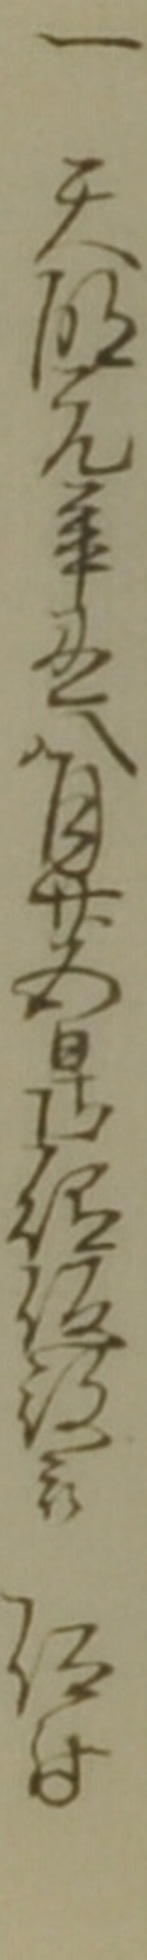一天明元辛丑八月廿五日御賄仮役被仰付
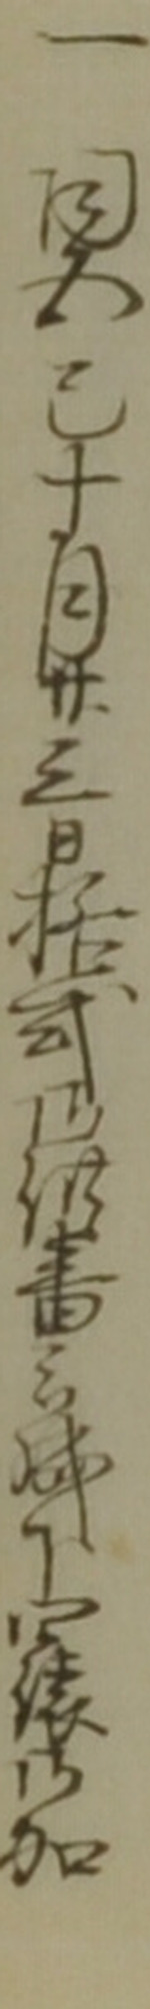一同五巳十月廿三日格式御供番被成下四俵御加
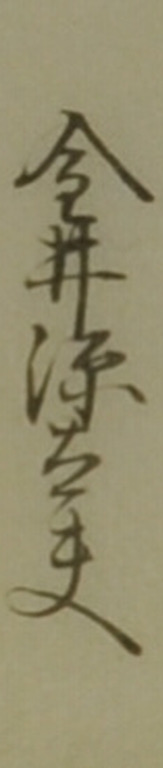金井源太夫
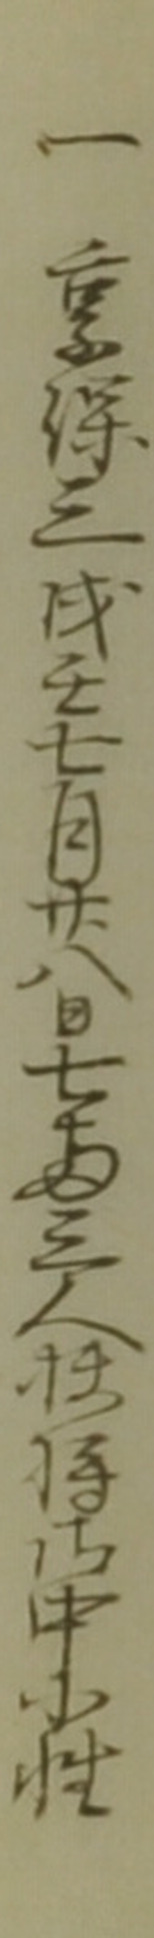一享保三戌閏七月廿八日七両三人扶持御中小性
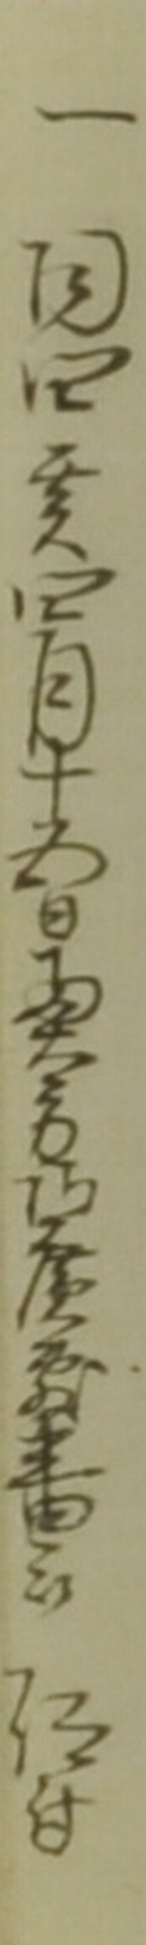一同四亥四月十五日奥方御広敷番被仰付

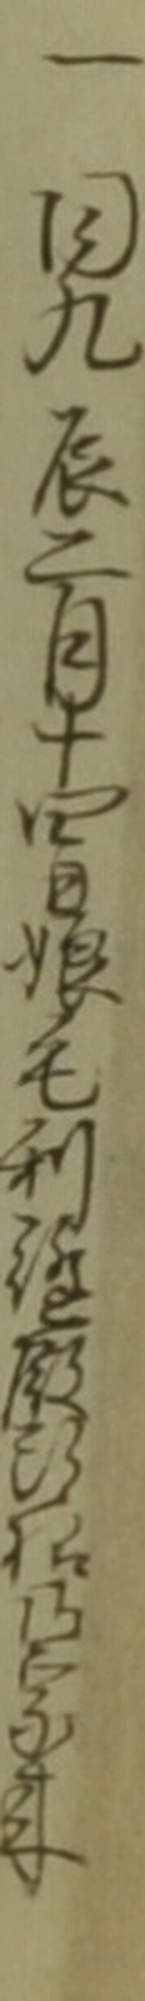一同九辰二月十四日娘毛利縫殿頭様御家来
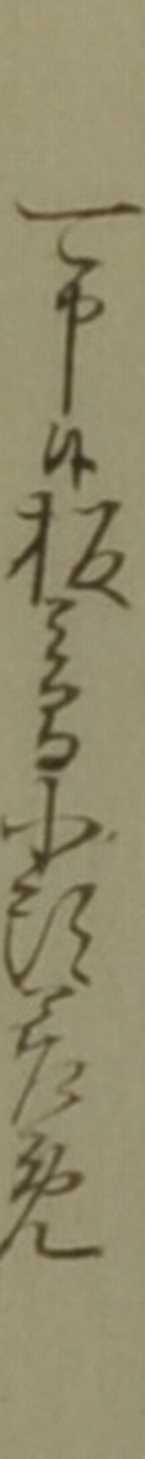可申候板之間小頭差免
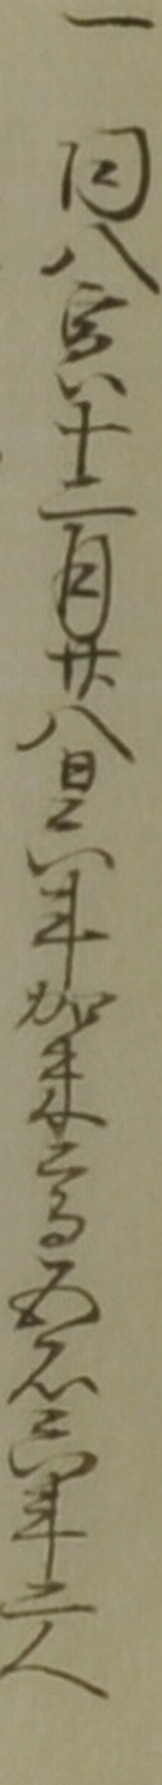一同八寅十二月廿八日六斗加米高五石六斗二人
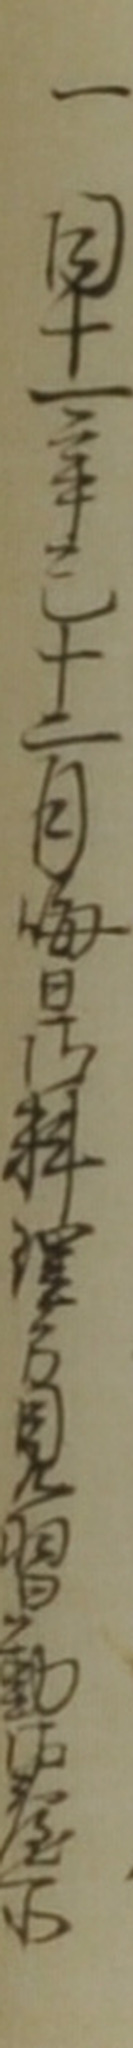一同十一辛巳十二月晦日御料理方見習勤御台所
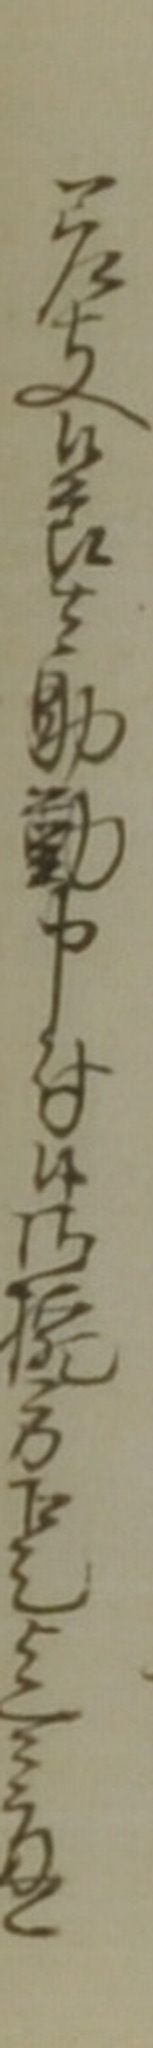差支候節物助勤申付候御椀方是迄之通
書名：無足廃家（壱）
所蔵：伊那市立高遠町図書館・合同会社AMANE
